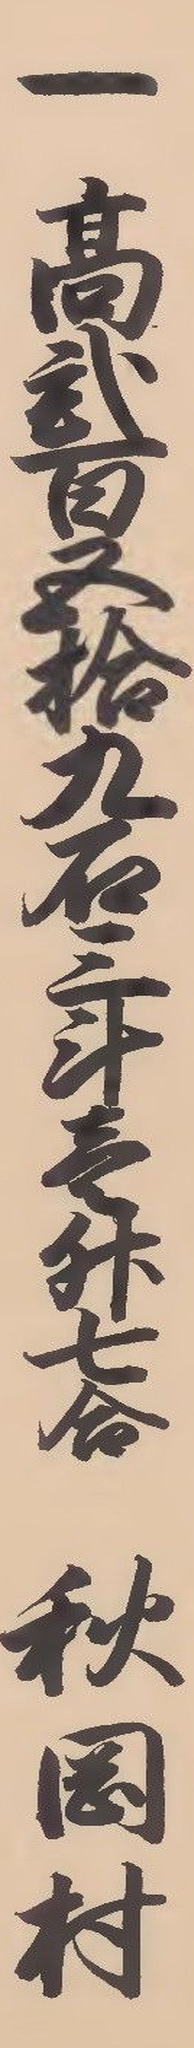一高弐百五拾九石三斗壱升七合秋岡村
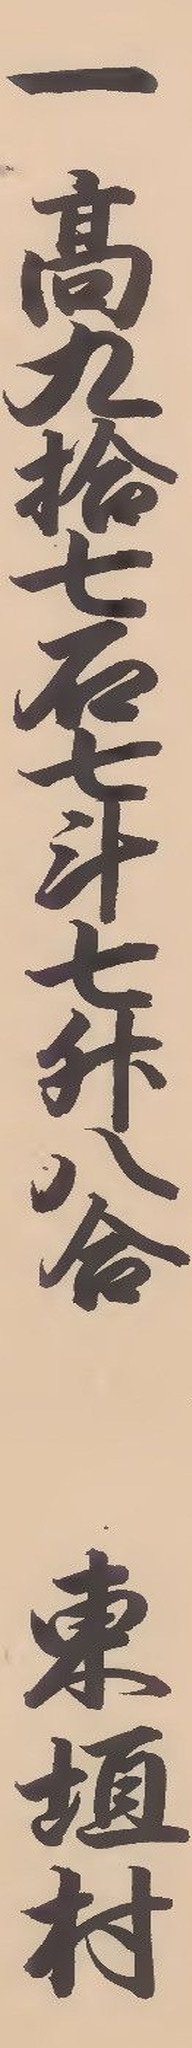一高九拾七石七斗七升八合東垣村

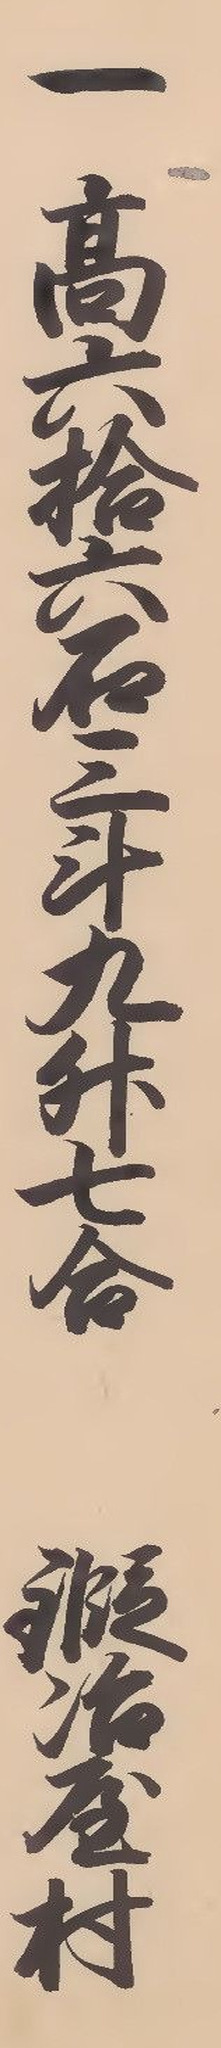一高六拾六石三斗九升七合鍛冶屋村
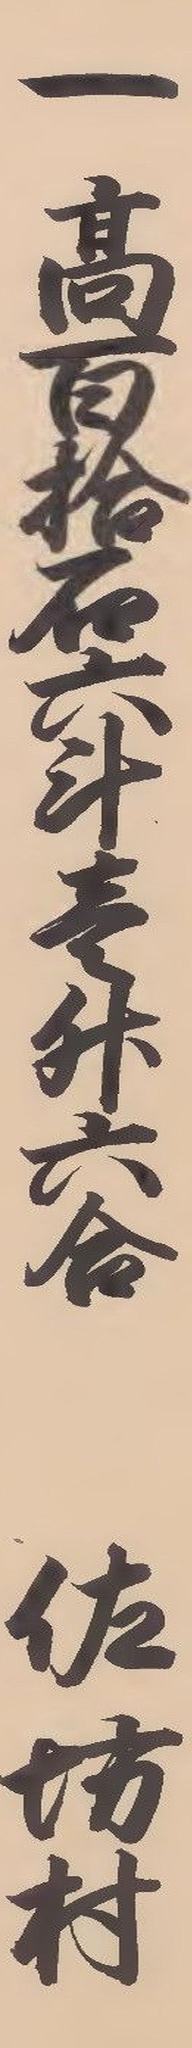一高百拾石六斗壱升六合佐坊村
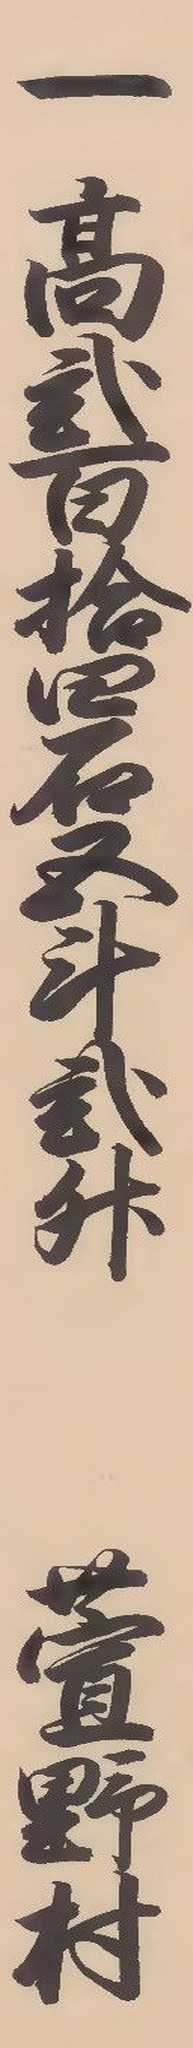一高弐百拾四石五斗弐升萱野村
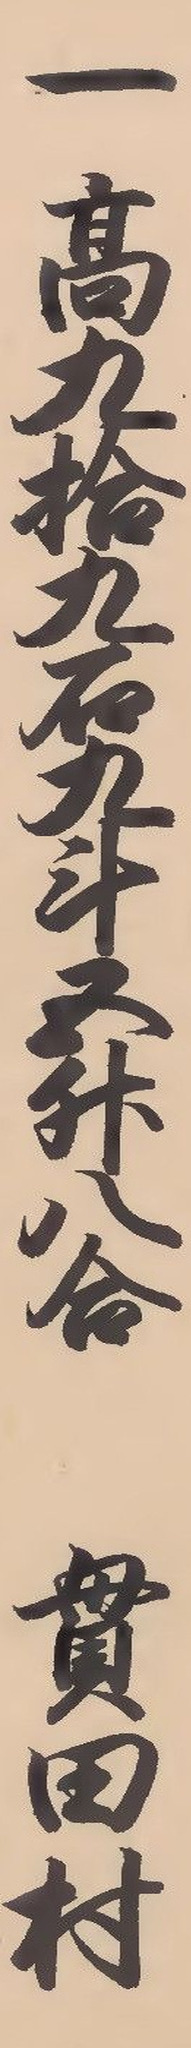一高九拾九石九斗五升八合貫田村
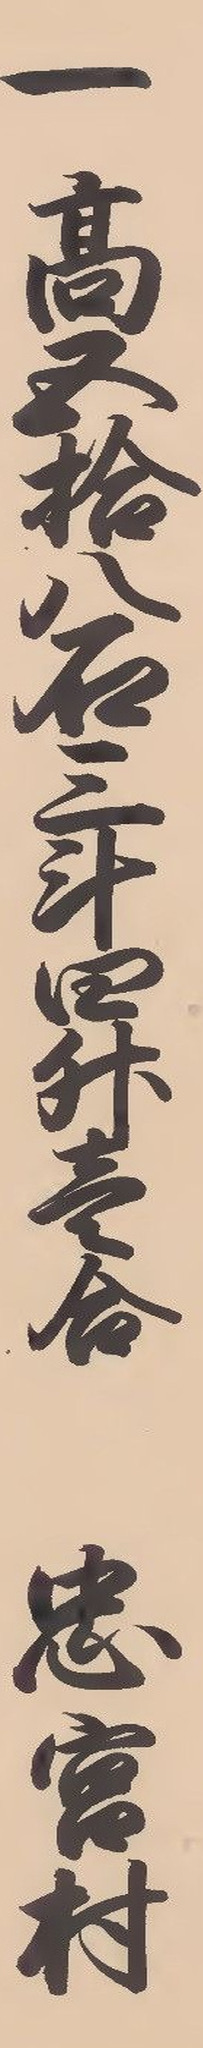一高五拾八石三斗四升壱合忠宮村
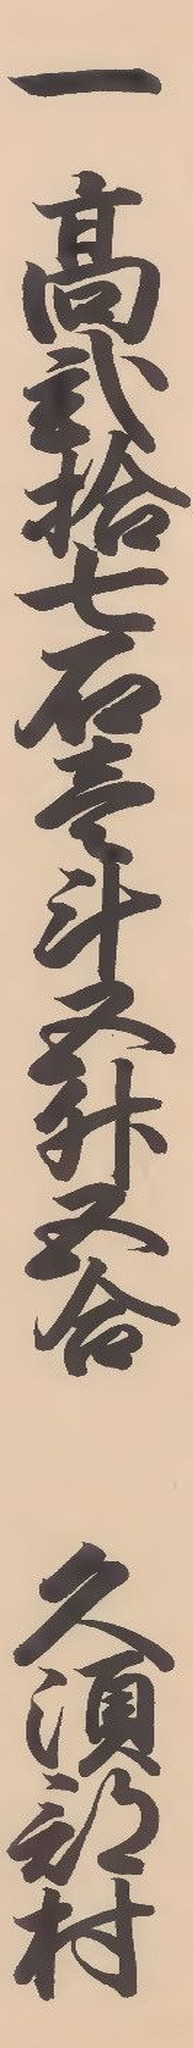一高弐拾七石壱斗五升五合久須部村
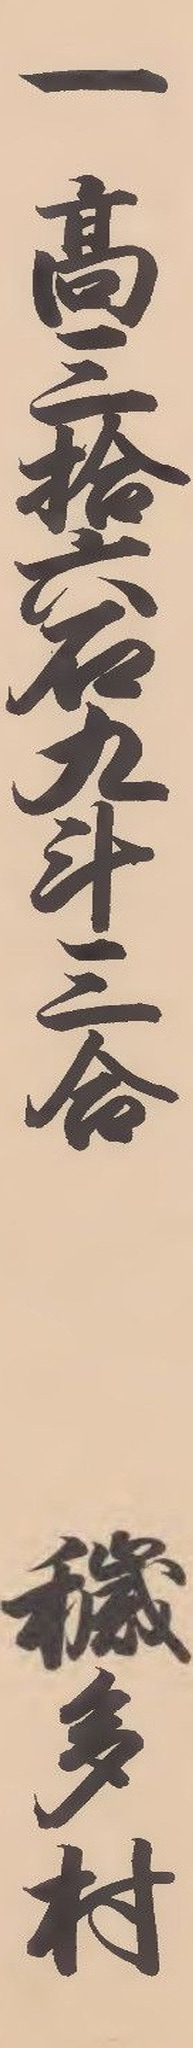一高三拾六石九斗三合穢多村
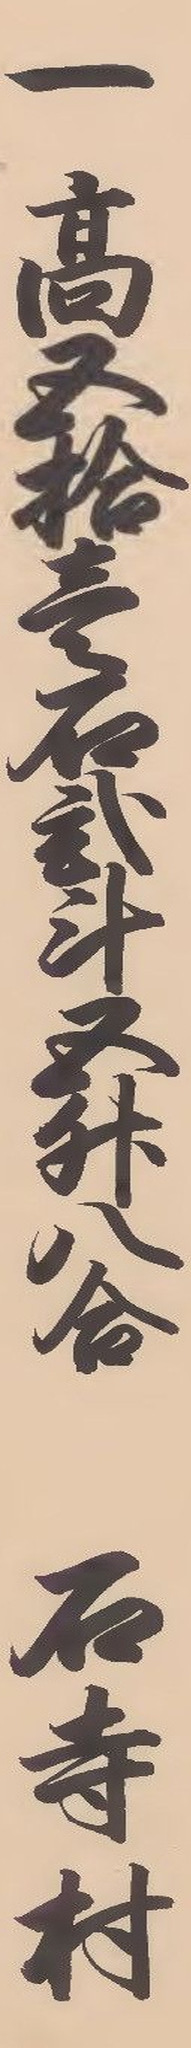一高五拾壱石弐斗五升八合石寺村

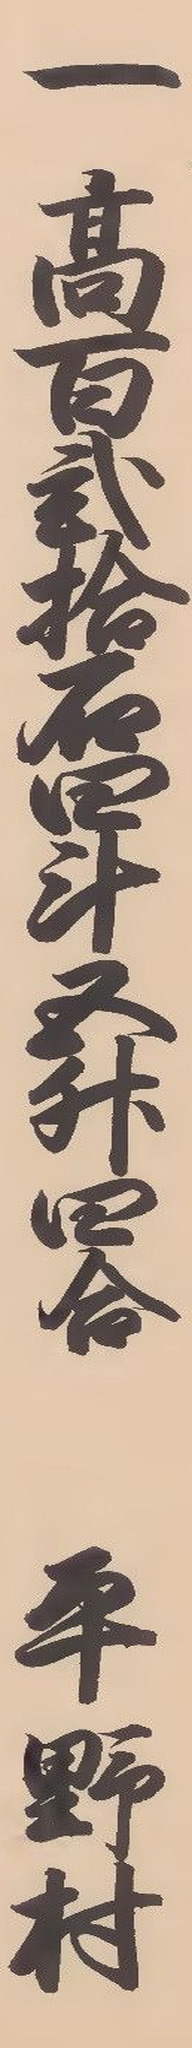一高百弐拾石四斗五升四合平野村
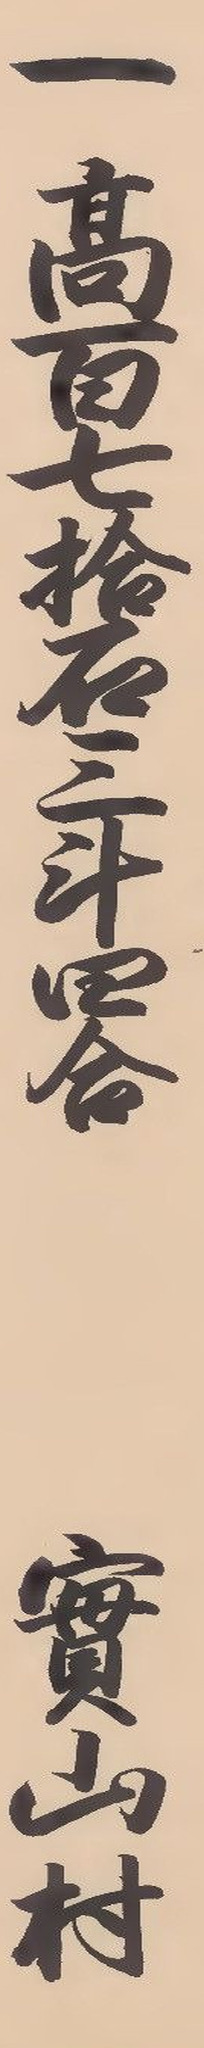一高百七拾石三斗四合実山村
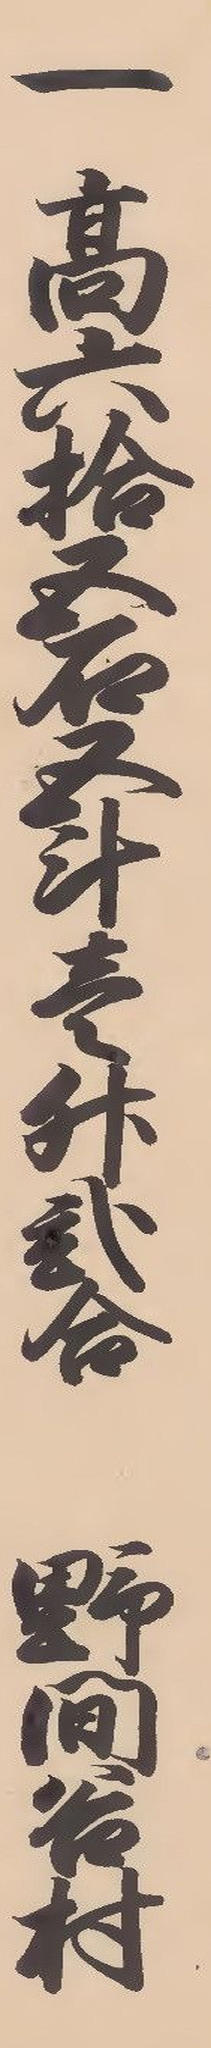一高六拾五石五斗壱升弐合野間谷村
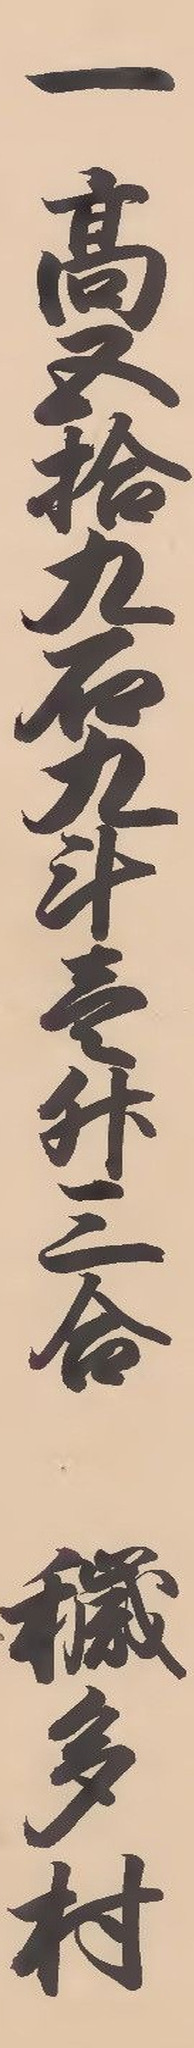一高五拾九石九斗壱升三合穢多村
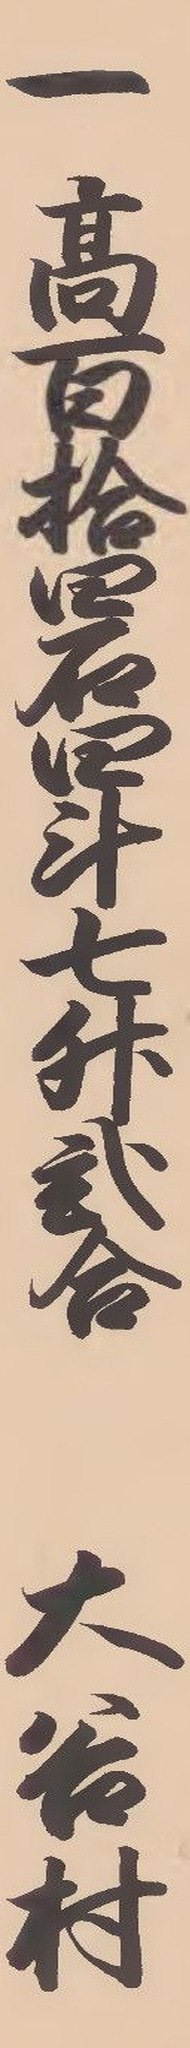一高百拾四石四斗七升弐合大谷村
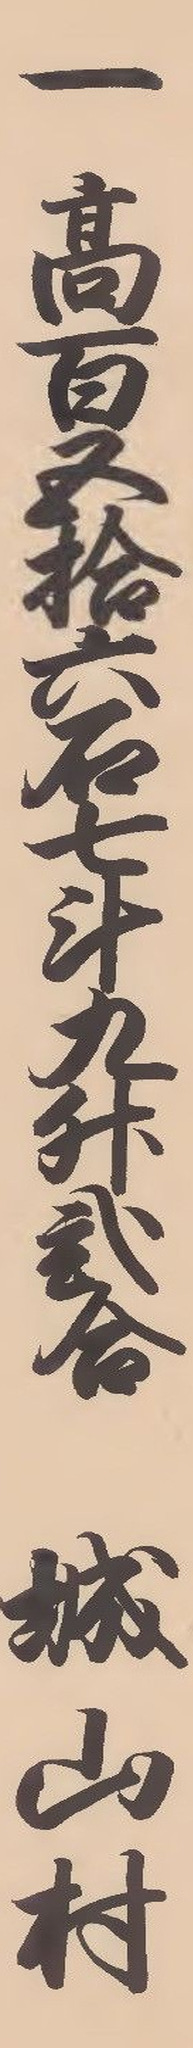一高百五拾六石七斗九升弐合城山村
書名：但馬国郷帳
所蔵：国立公文書館 National Archives of Japan
